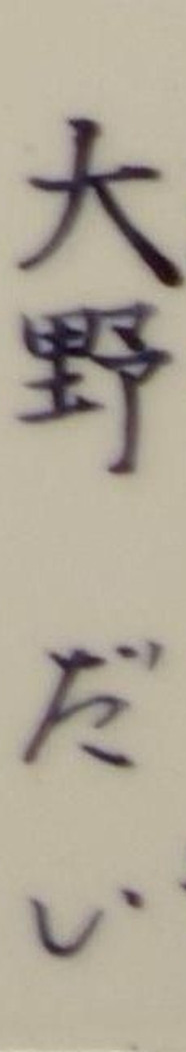大野だい
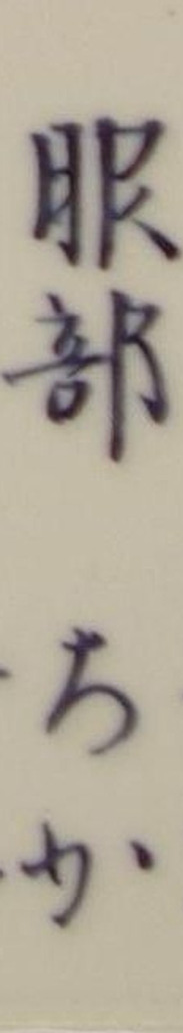服部ちか
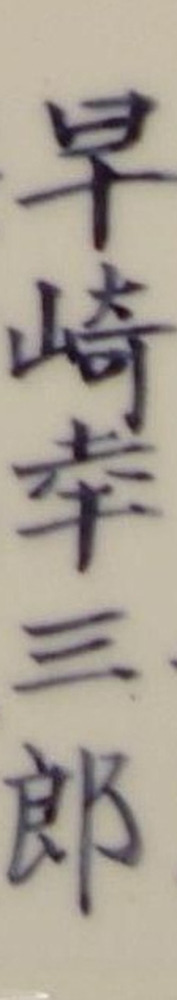早崎幸三郎
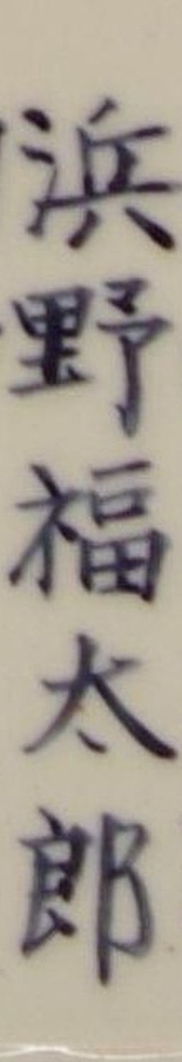浜野福太郎
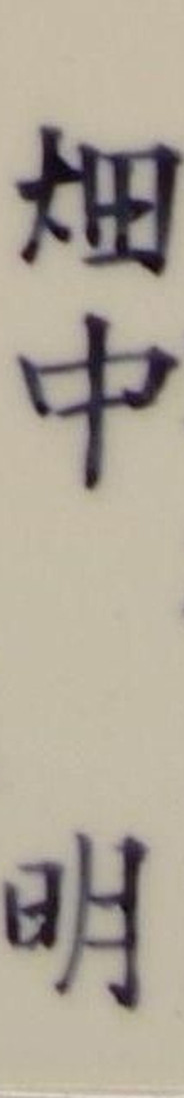畑中明
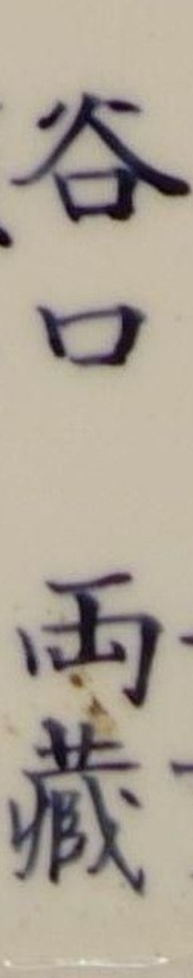谷口両蔵
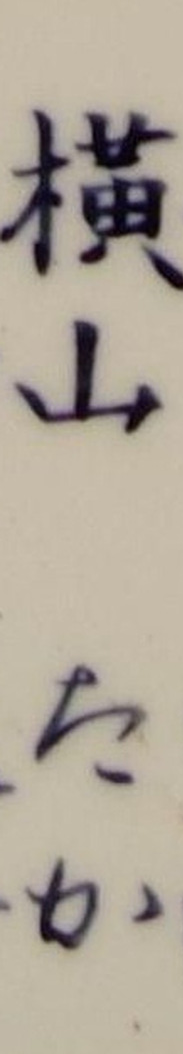横山たか
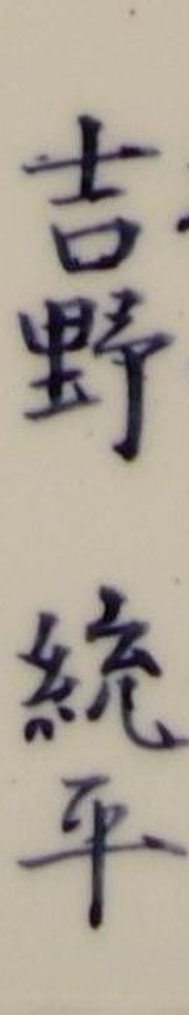吉野統平
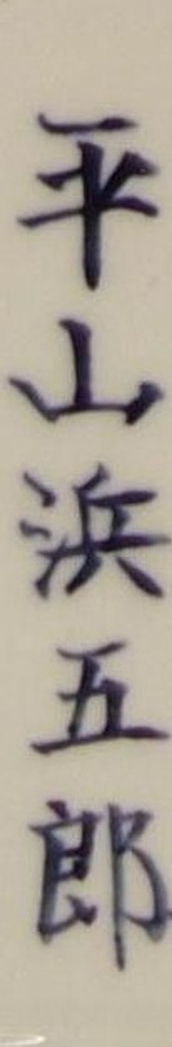平山浜五郎
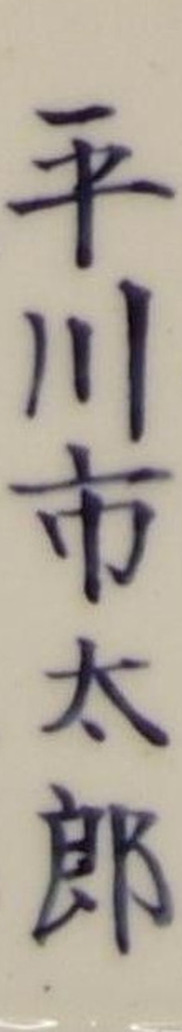平川市太郎
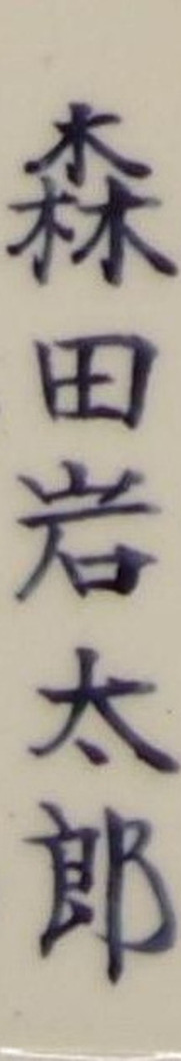森田岩太郎
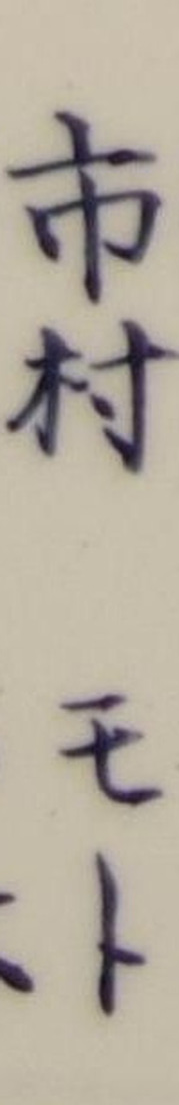市村モト
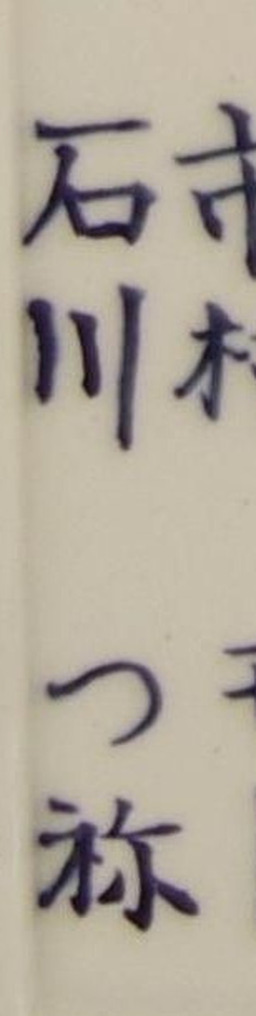石川つね

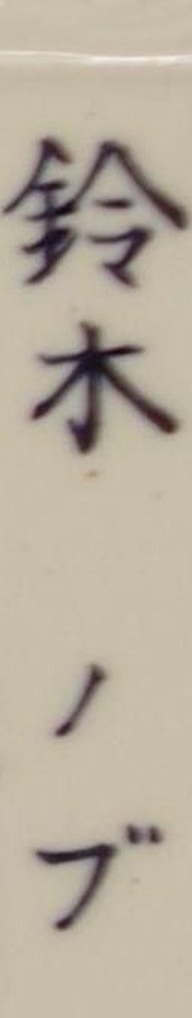鈴木ノブ
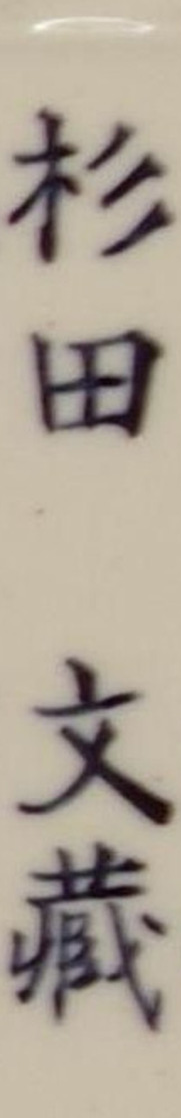杉田文蔵
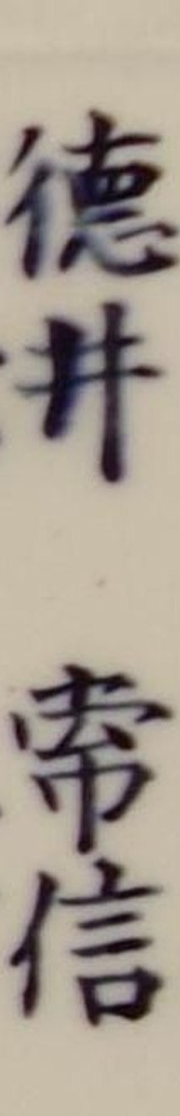徳井常信
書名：E~L
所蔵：高野山金剛峯寺
